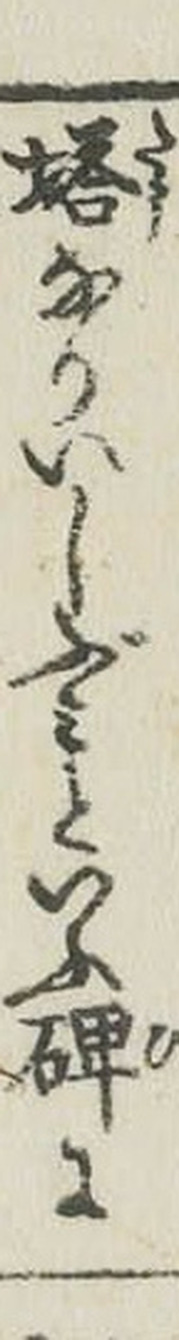塔なりいしぶみといふ碑に
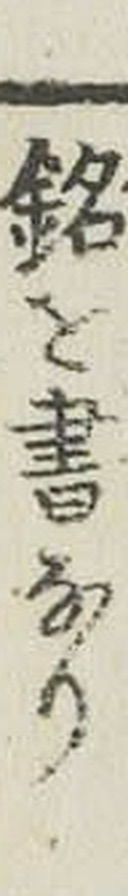銘を書なり
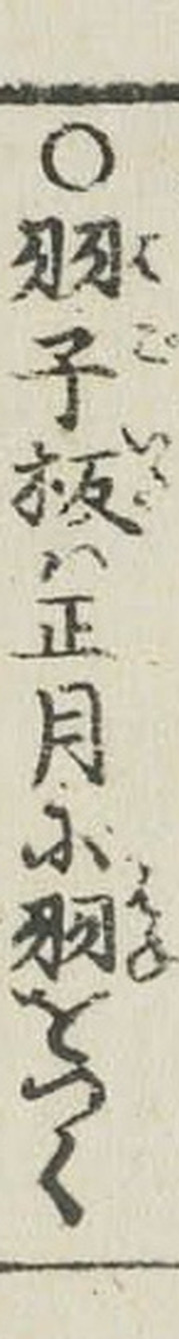○羽子板は正月に羽をつく
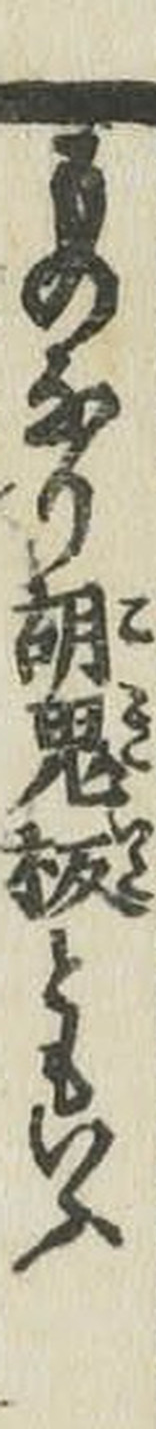ものなり胡鬼板ともいふ
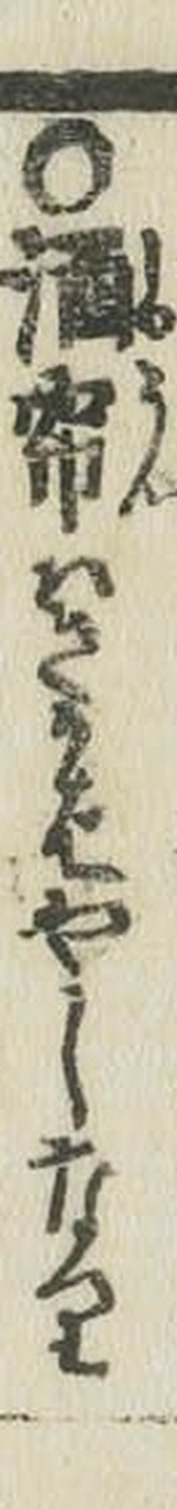○酒帘はさかばやしなり
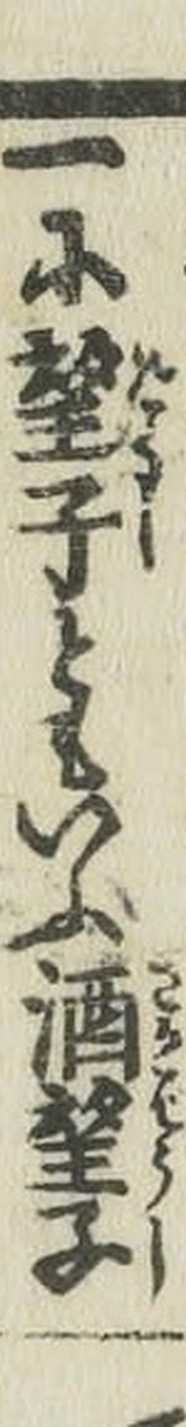一に望子ともいふ酒望子
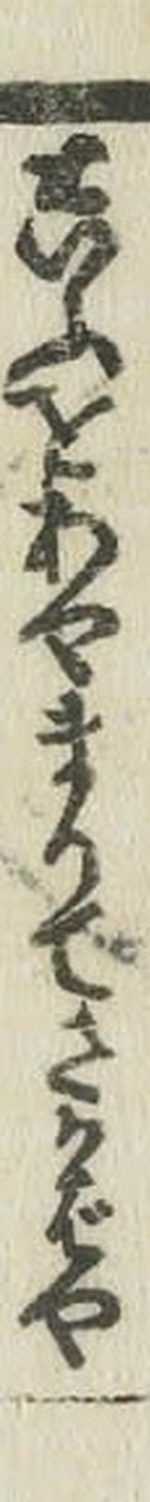といふをあやまりてさかばや
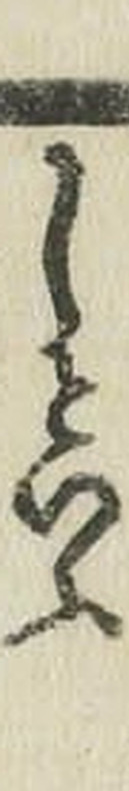しといふ
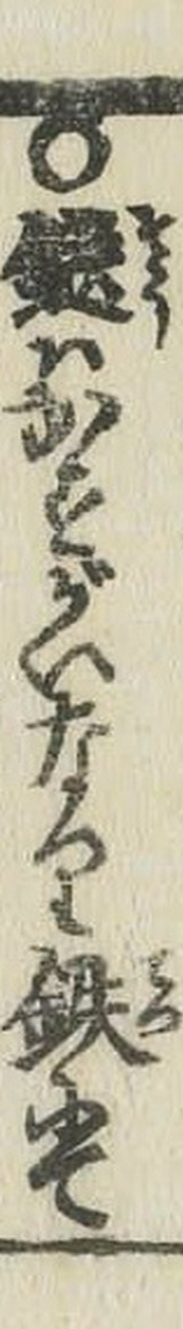○鎹はかすがいなり鉄にて
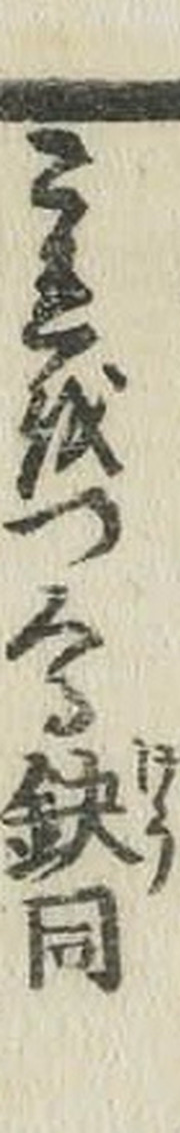これをつくる鈌同
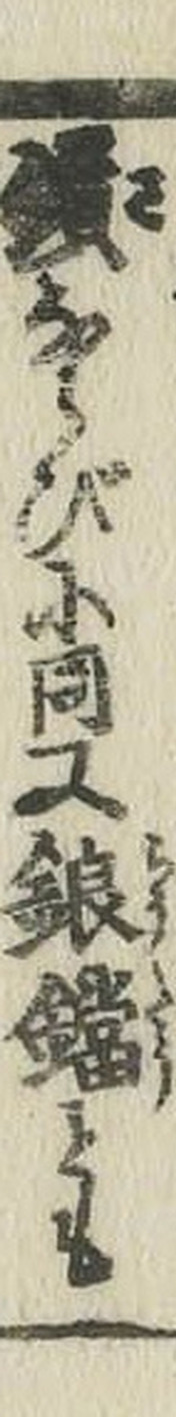鎖ならびに同又鋃鐺とも
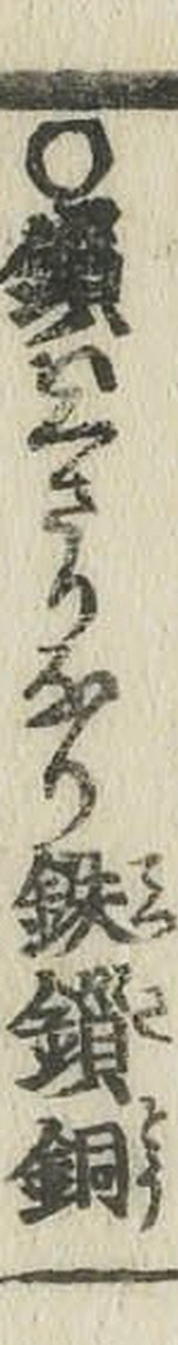○鎖はくさりなり鉄鎖銅
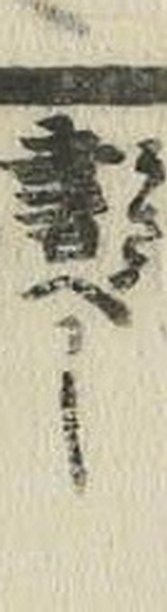書べし
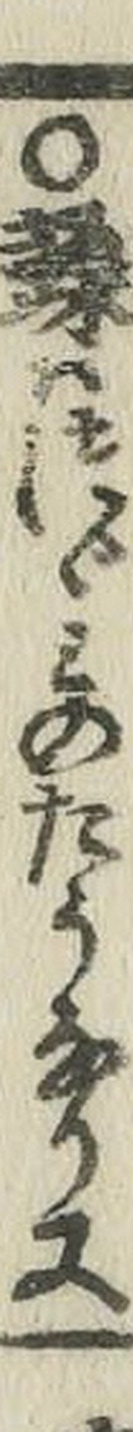○𣞙はつゞみのたうなり又
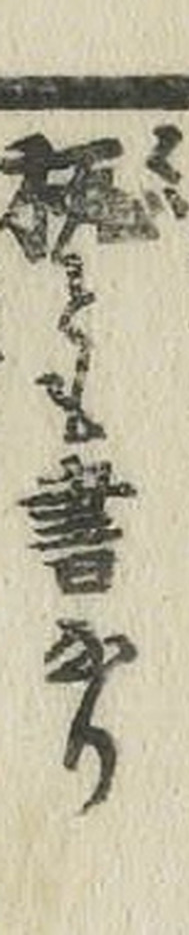𣐎とも書なり
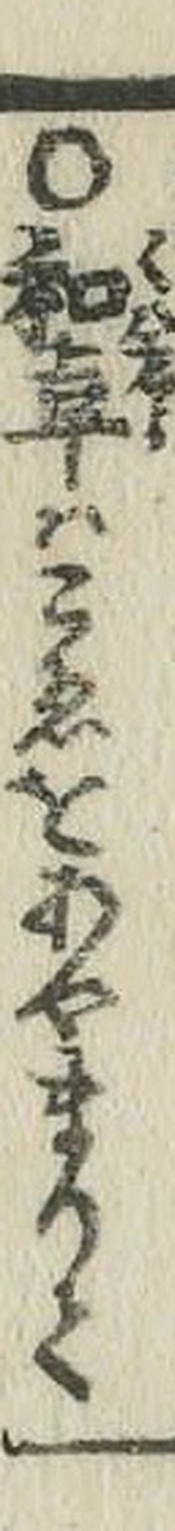○和卓はこゑをあやまりて
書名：増補頭書訓蒙図彙大成 10巻 5:巻之9-11
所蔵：東京学芸大学教育コンテンツアーカイブ
